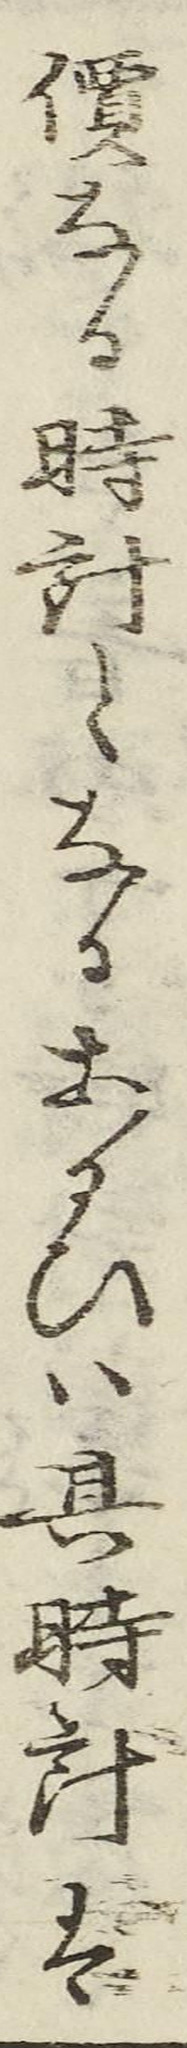価なる時計となるあるひは其時計は
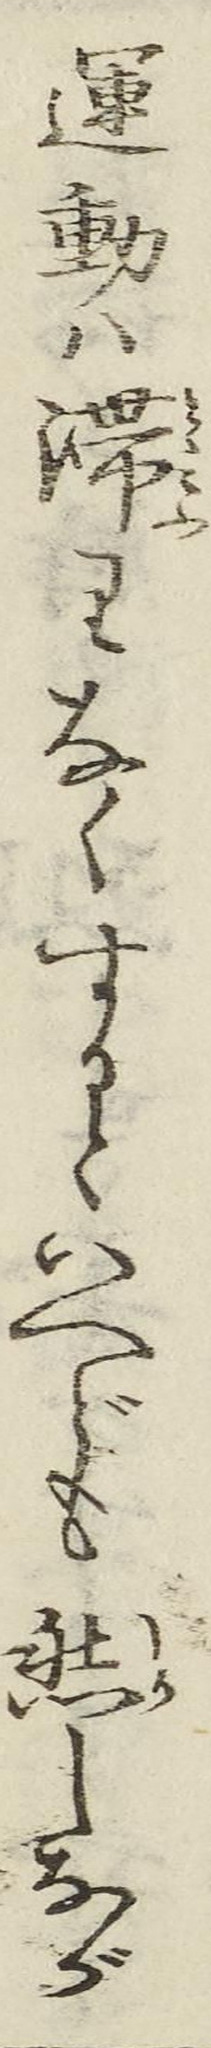運動は滞りなくするといへども然しなが
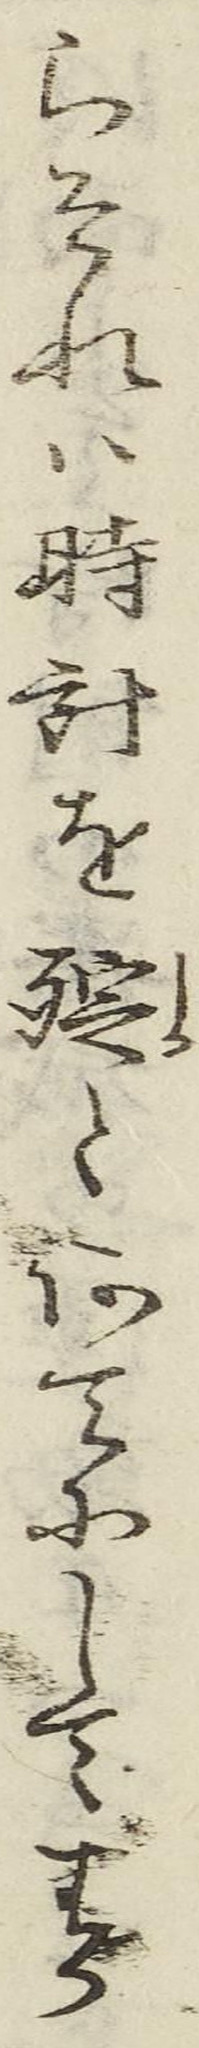らそれは時計を聢とあてにしてはか
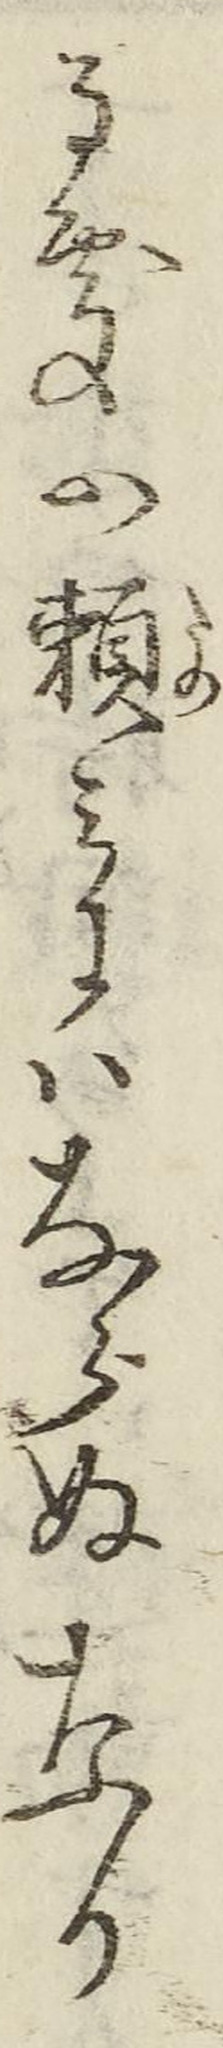る処の頼みにはならぬなり
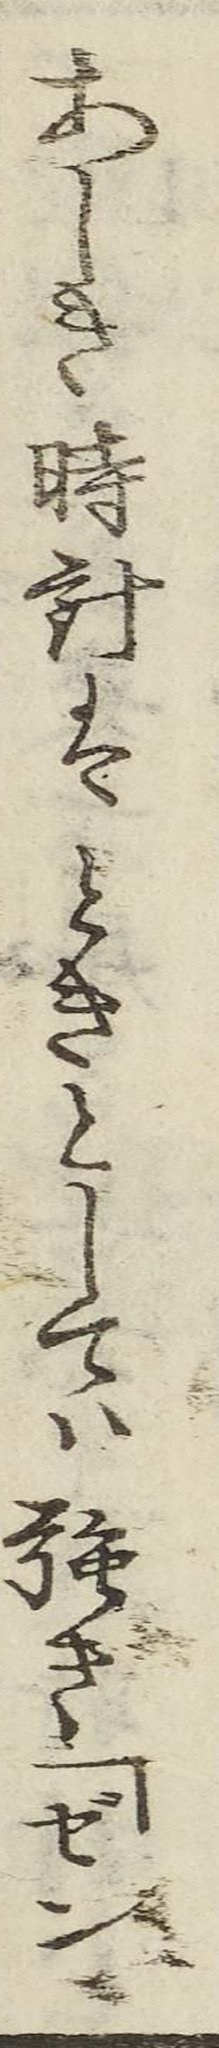あしき時計はときとしては強き「ゼン

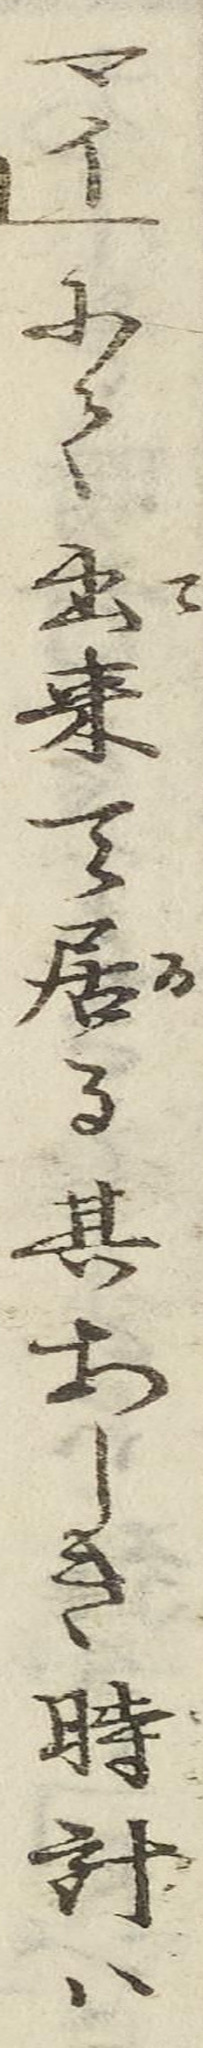マイ」にて出来て居る其あしき時計は
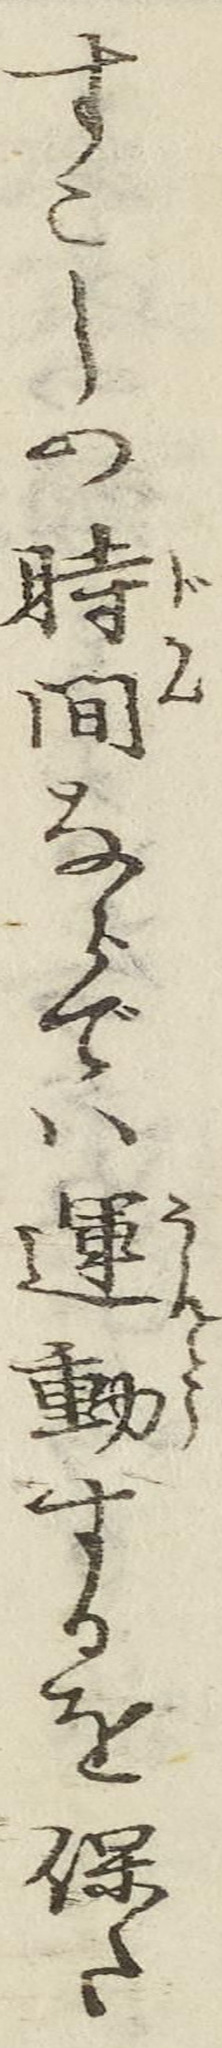すこしの時間ならでは運動するを保た
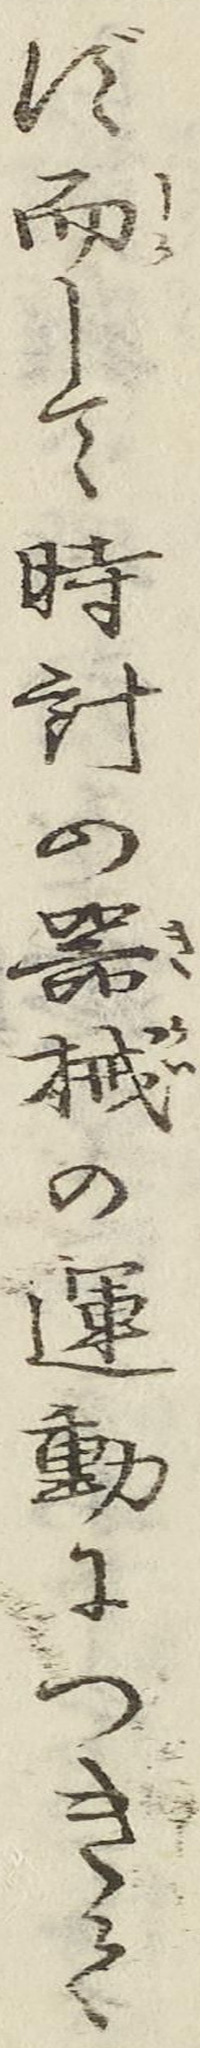ず而して時計の器械の運動につきて
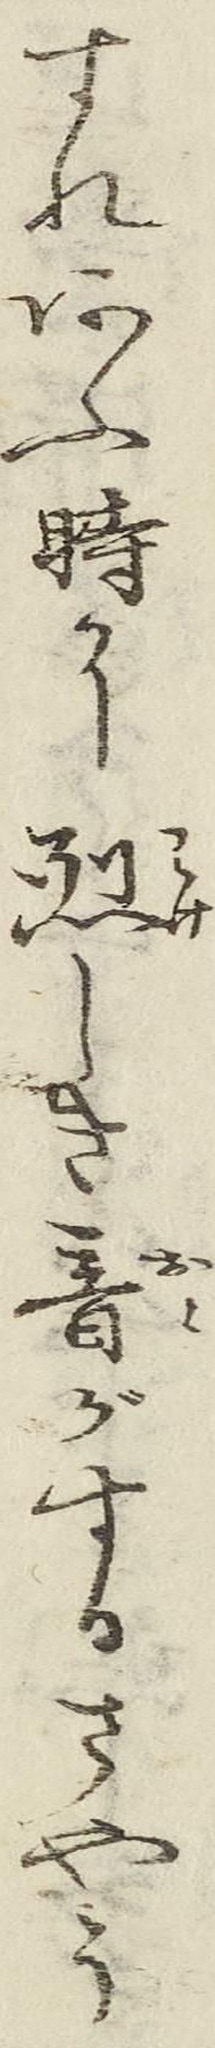すれあふ時に烈しき音がするさやう
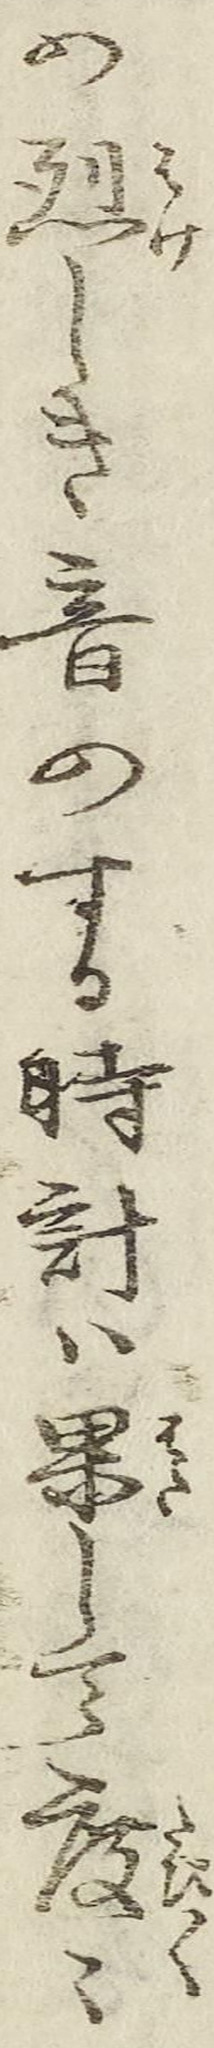の烈しき音のする時計は果して度〻
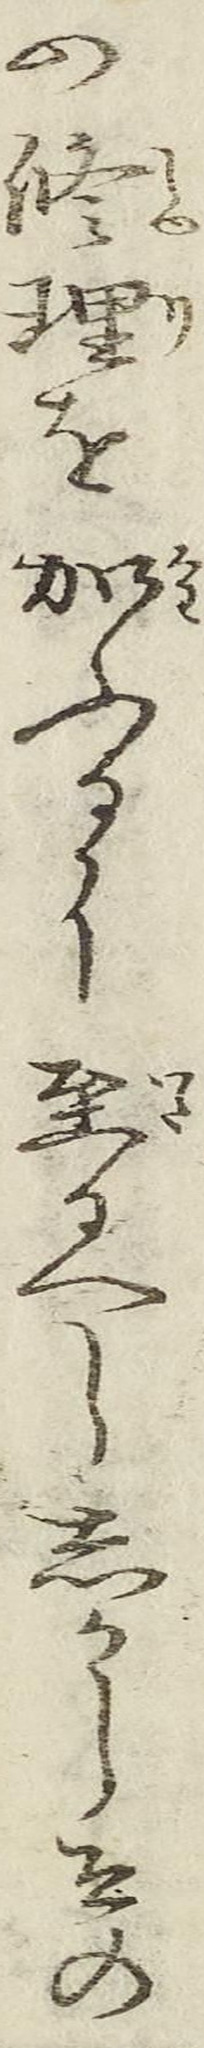の修理を加ふるに至るへししかしその
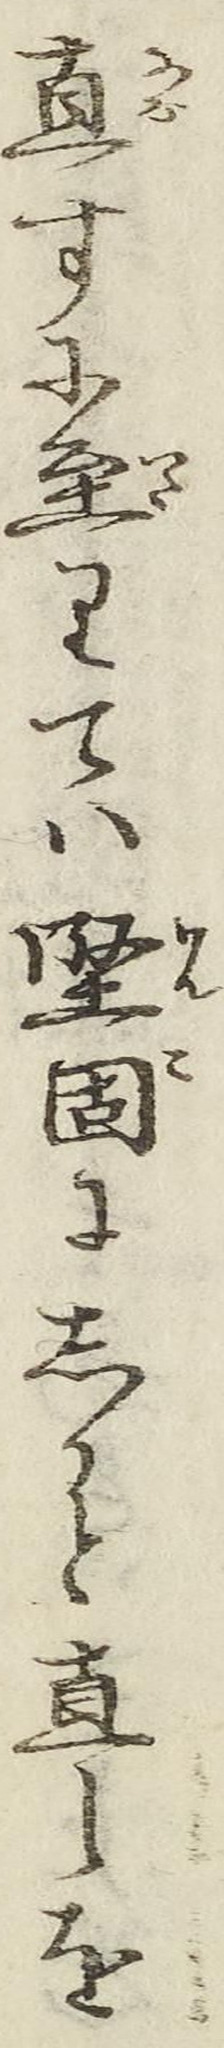直すに至りては堅固にしかと直しを
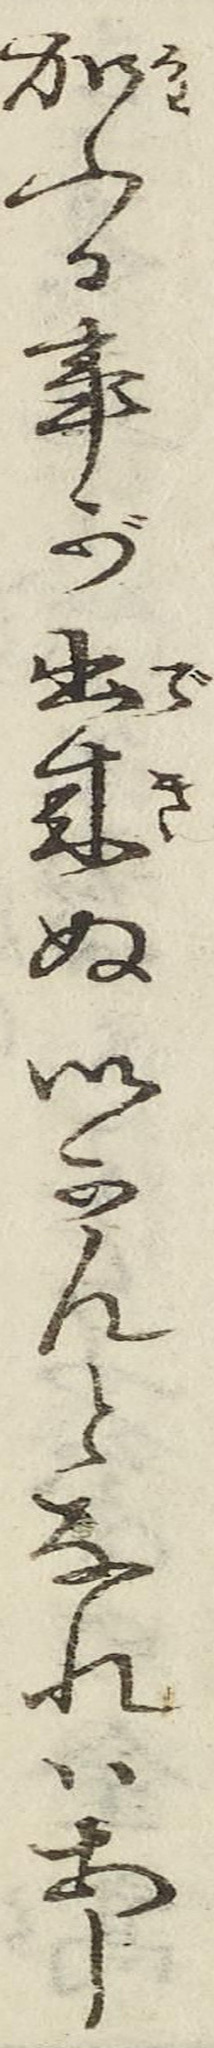加ふる事が出来ぬいかんとなれはあし
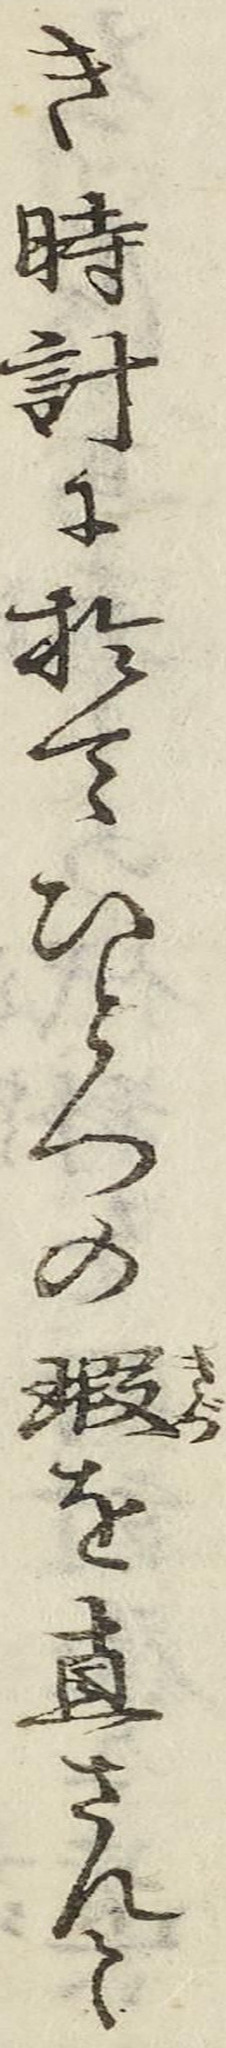き時計に於てひとつの瑕を直さんと
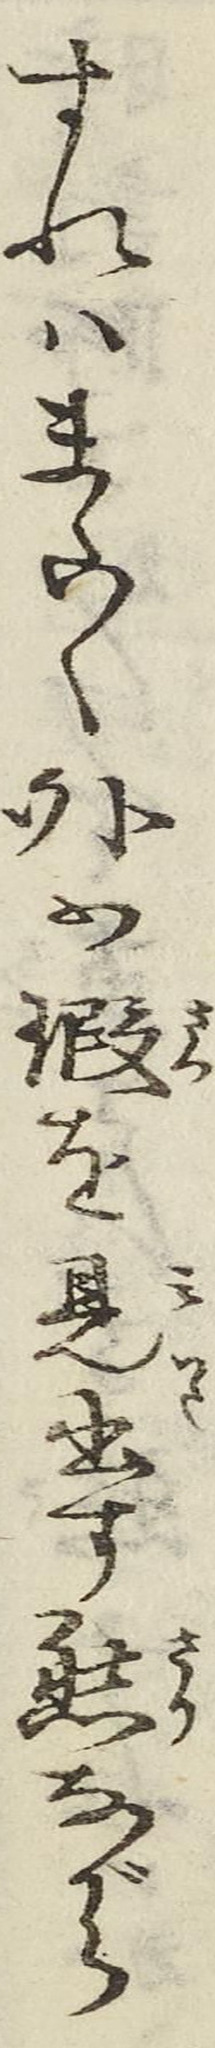すれはまた〳〵外の瑕を見出す然ながら
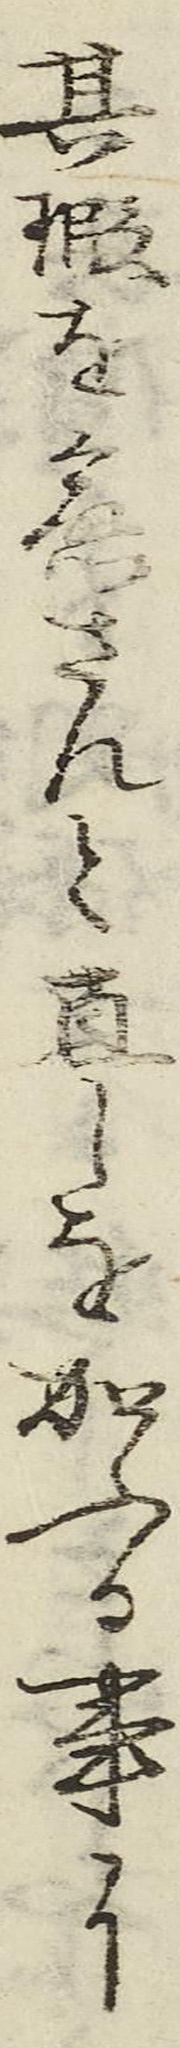其瑕を愈さんと直しを加ふる事に
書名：[時計に関する冊子]
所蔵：東京大学地震研究所図書室 Earthquake Research Institute Library, The University of Tokyo, JAPAN
